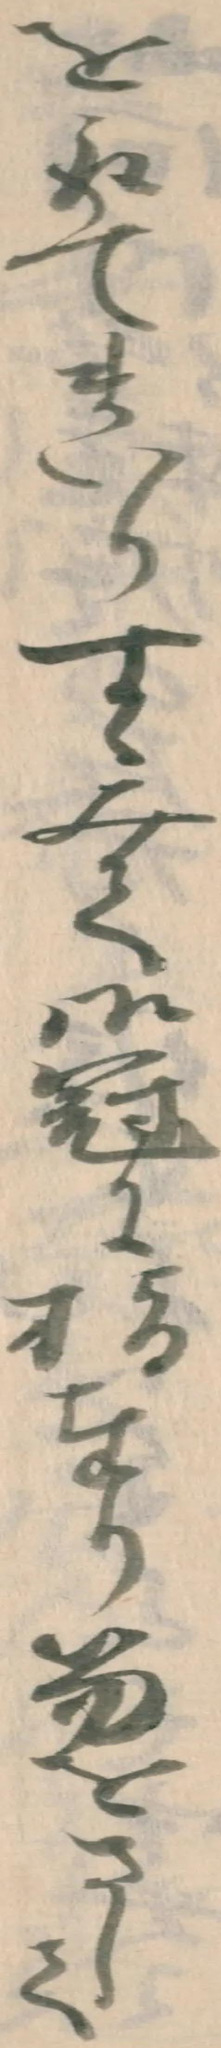を取てまいりすゝみて御冠に指奉り笏をさして
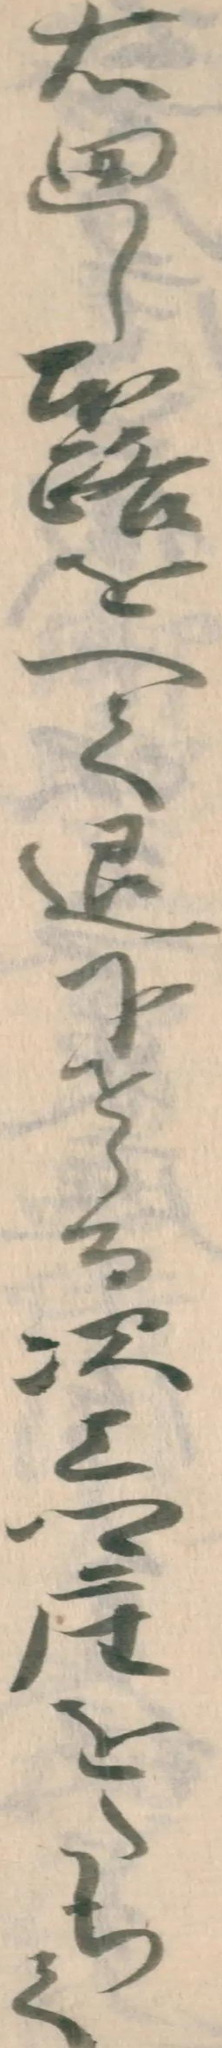右廻し本路をへて退下せらる次上卿座をたちて
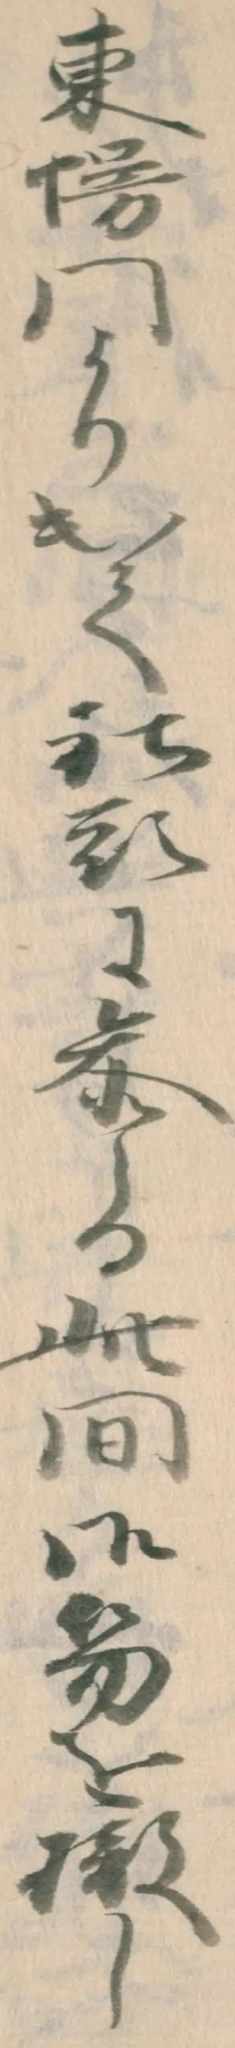東幔門より出て社頭に参らる此間御笏を撤し
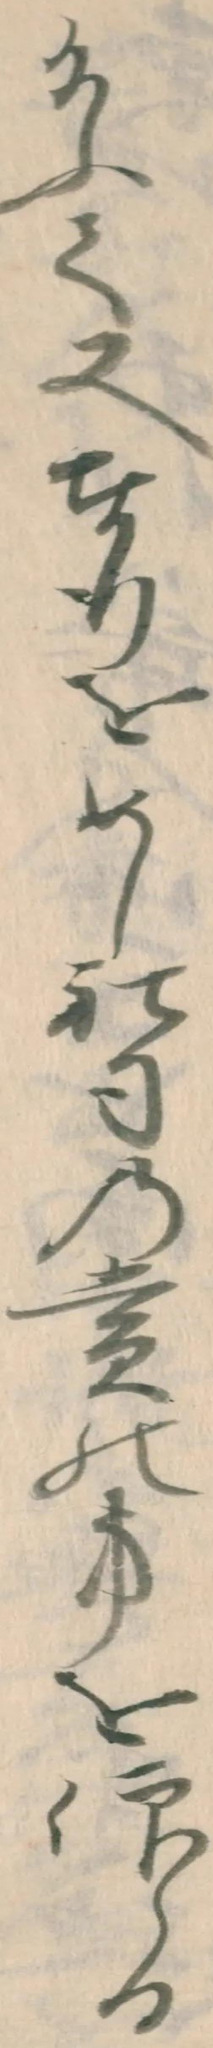給ふて又奉行をめし社司の賞の事を仰らる
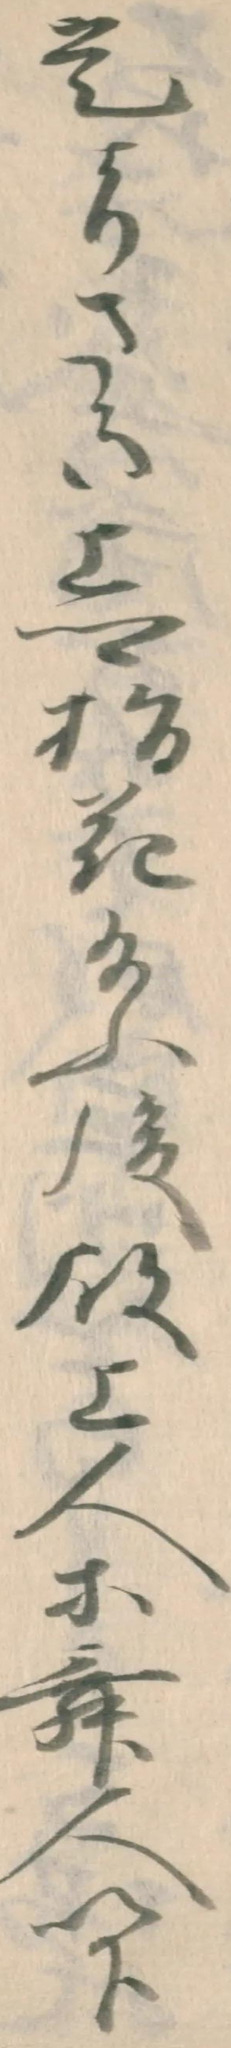是よりさき上卿指花給ふ後殿上人等舞人以下
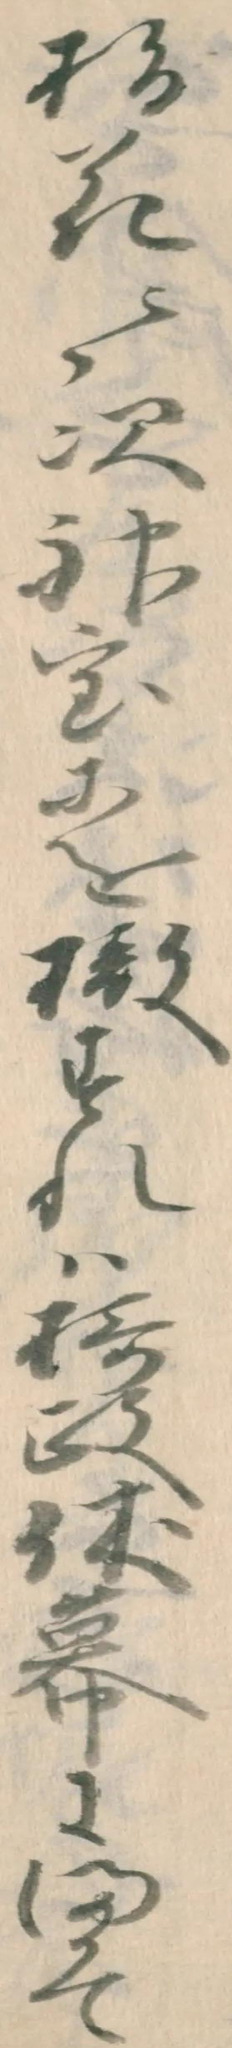指花云々次神宝等を撤すれは摂政休幕にまかて
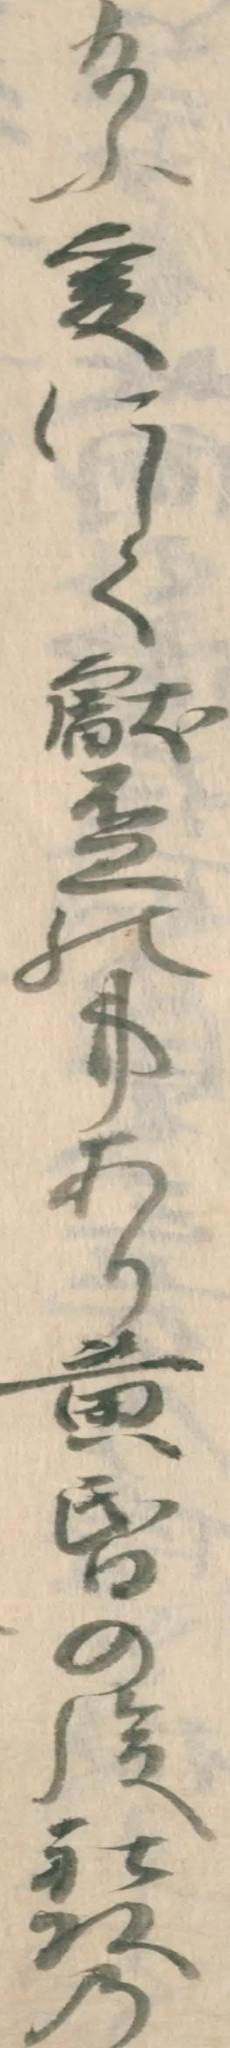給ふ爰にして献盃の事あり黄昏の後社頭の
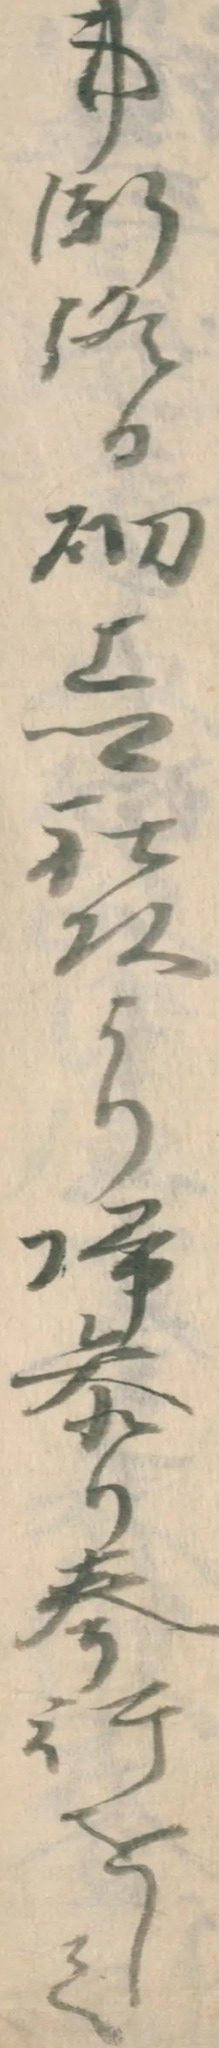事漸終る砌上卿社頭より帰参り奉行をして

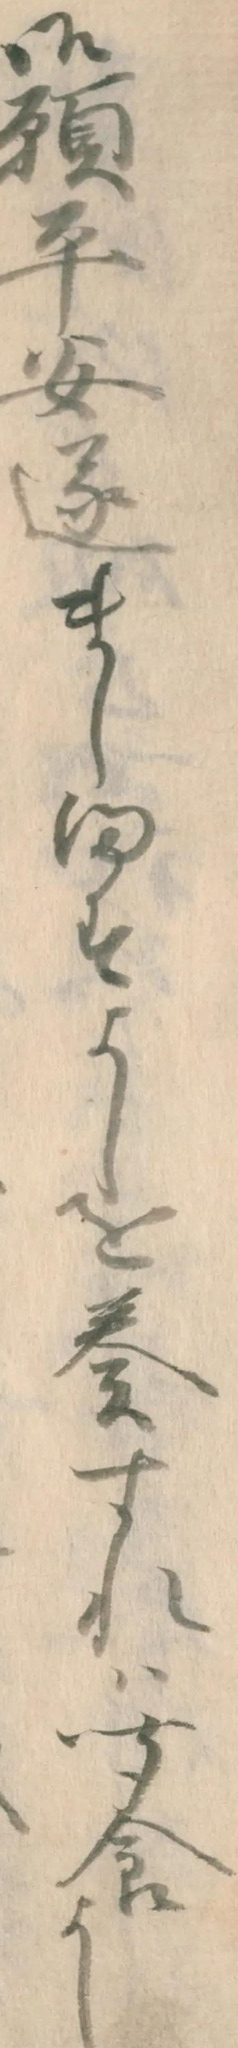御願平安遂ましますよしを奏すれは聞食よし
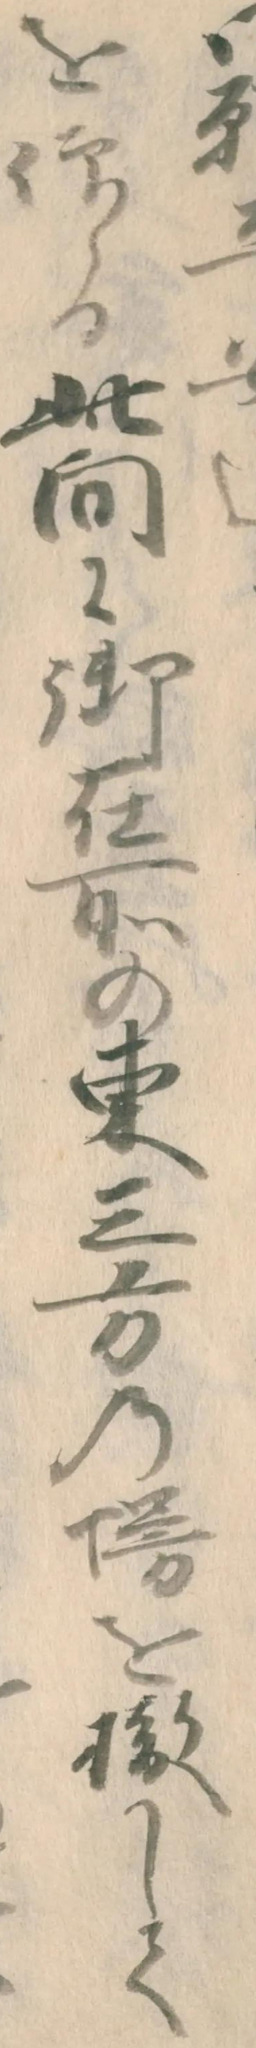を仰らる此間に御在所の東三方の幔を撤して
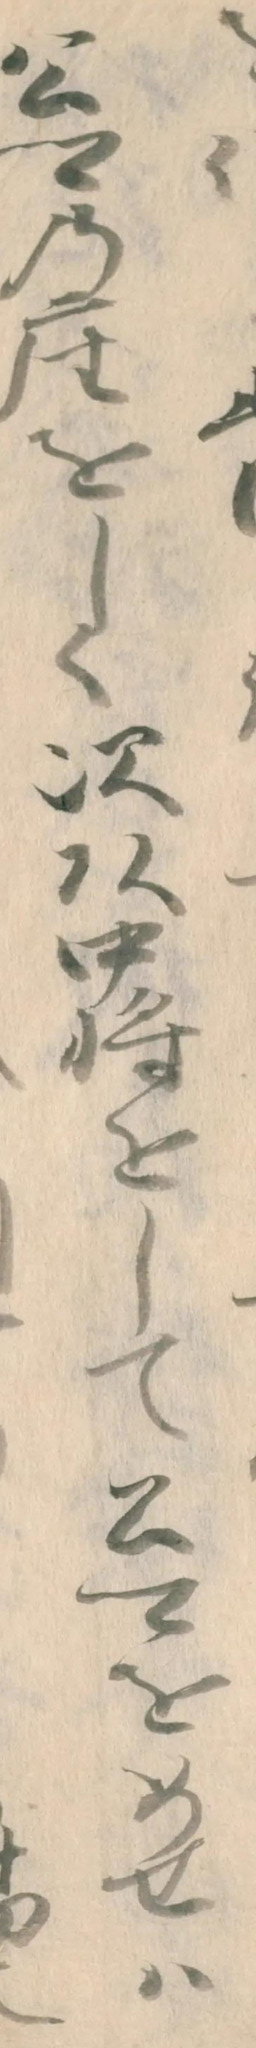公卿の座をしく次頭中将をして公卿をめせは
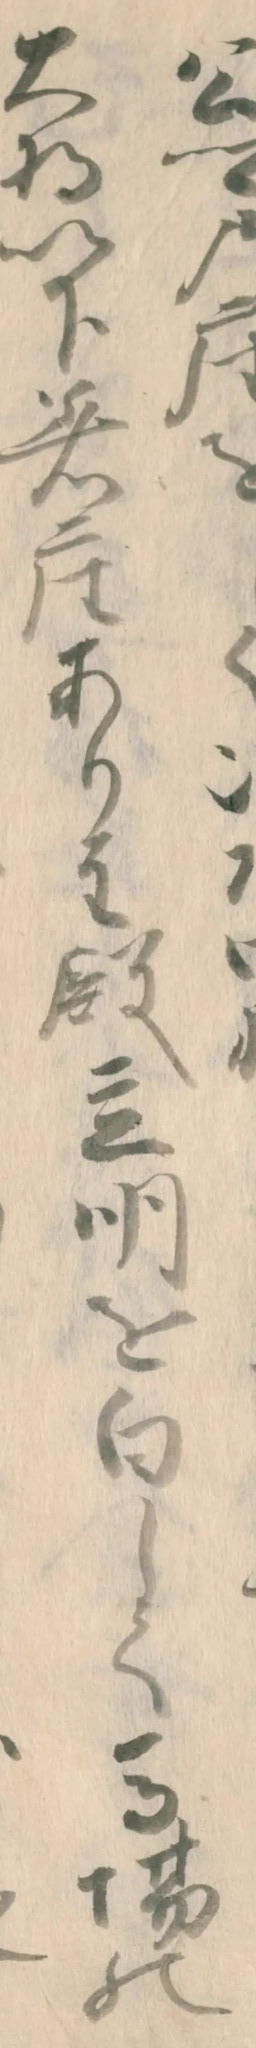大将以下着座あり主殿立明を白して馬場の
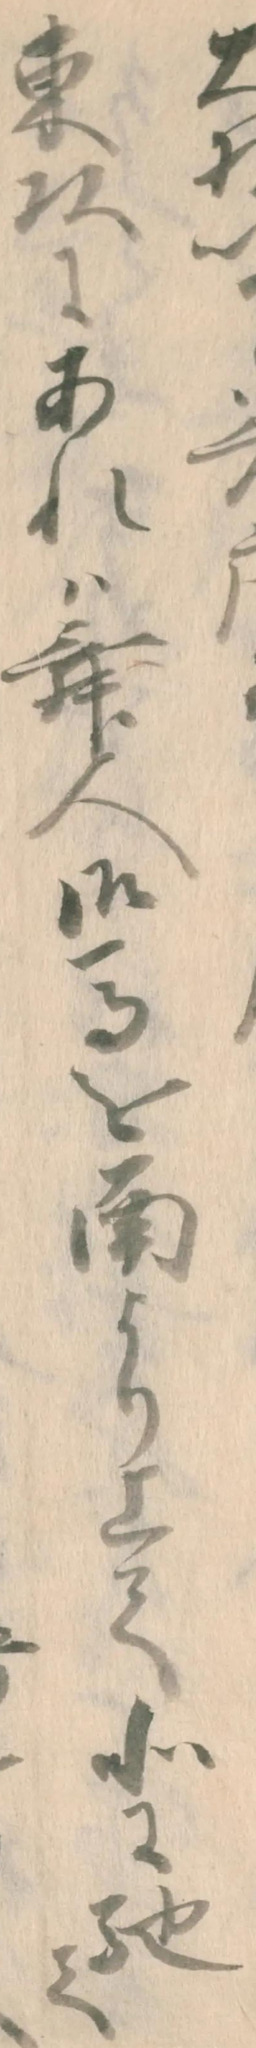東頭にあれは舞人御馬を南より上て北に馳て
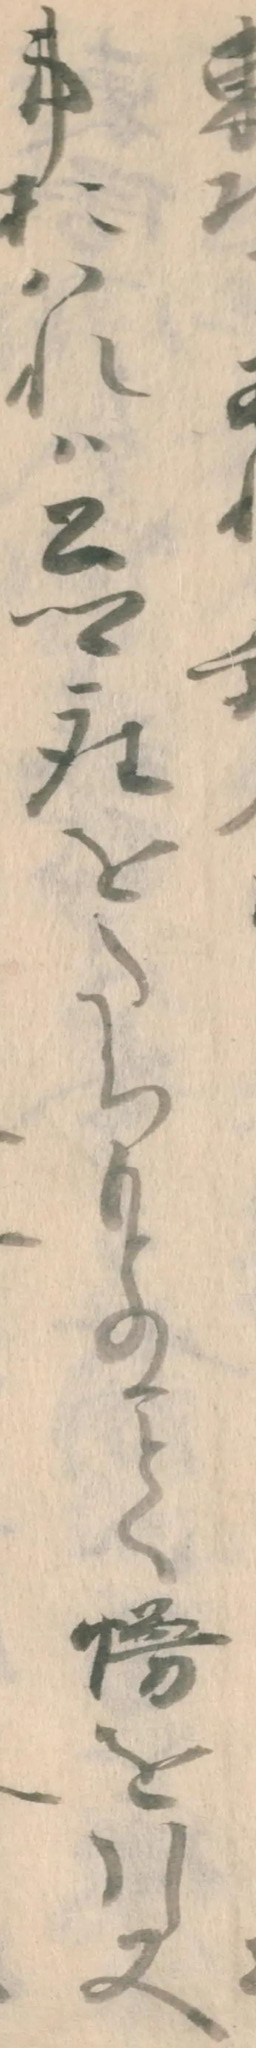事おはれは公卿座をたちもとのことく幔を引又
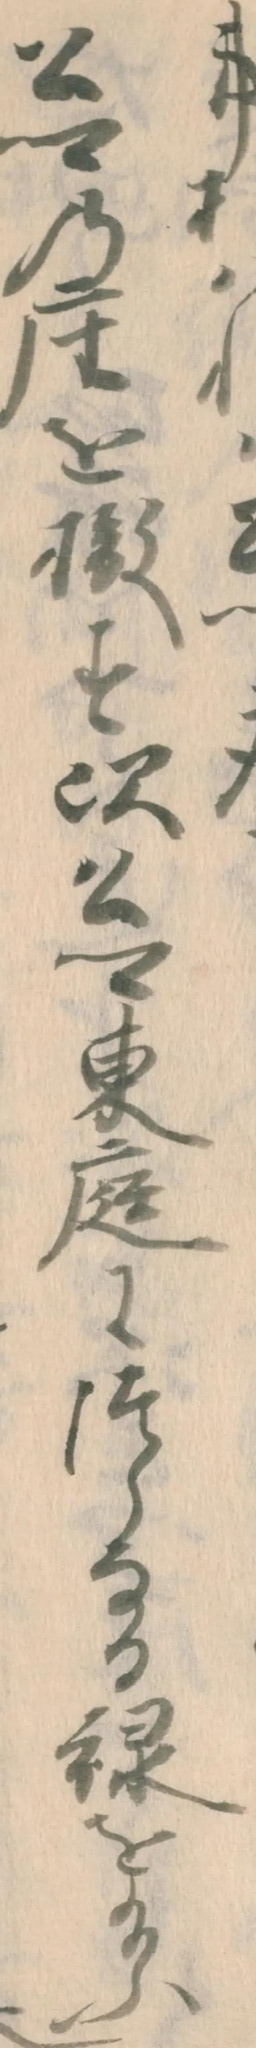公卿の座を撤す次公卿東庭につらなる禄を給ふ也
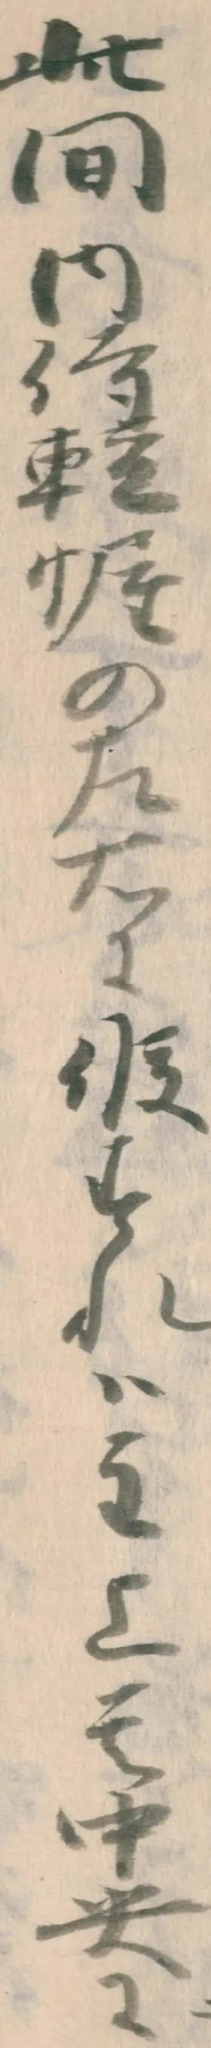此間内侍軽幄の左右に候すれは主上其中央に
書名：賀茂社記録. 第1冊
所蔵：国立国会図書館 National Diet Library, JAPAN
